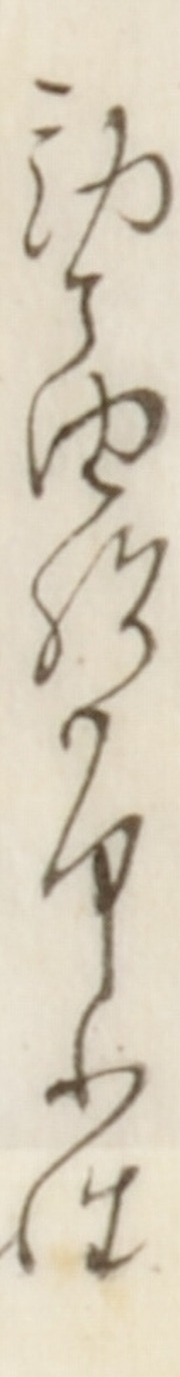勘ケ由様御中小姓
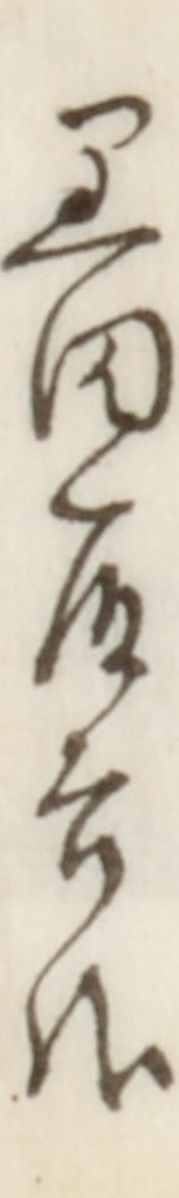黒田藤吉様
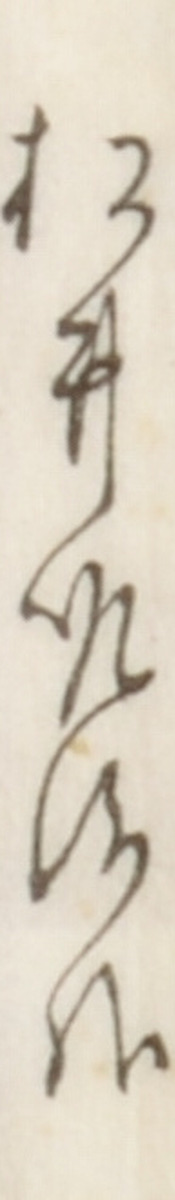松井順治様

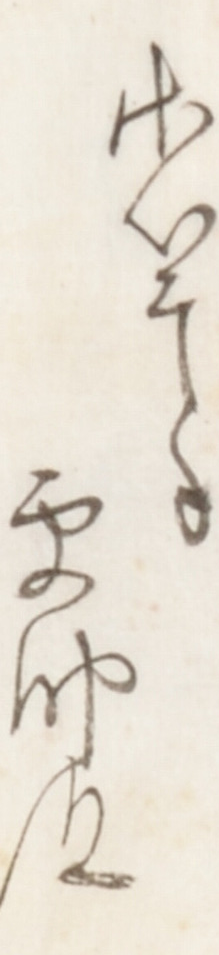平助殿
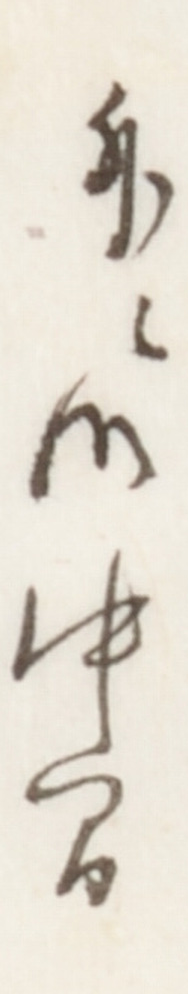外ニ御中間
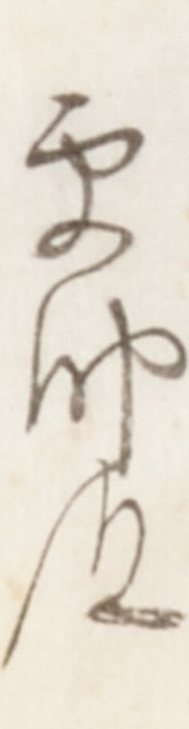平助殿
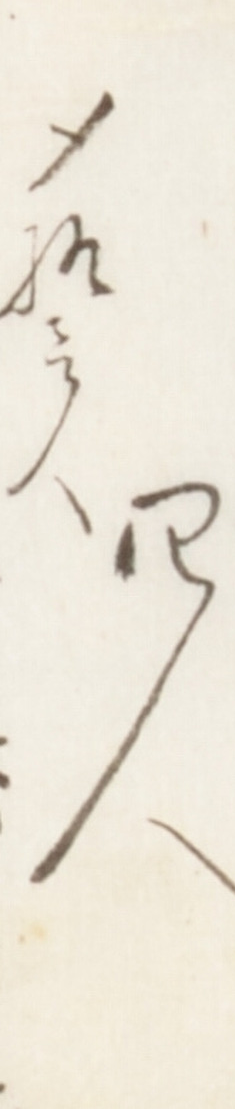〆拾壱人
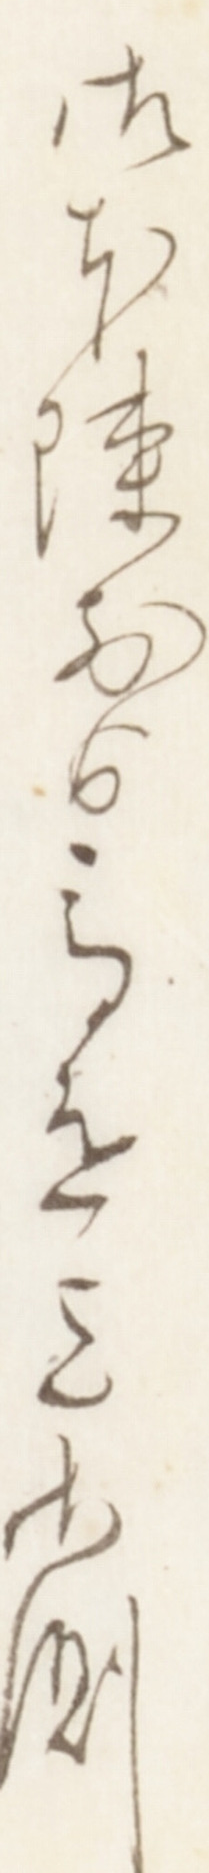御本陣前より高遠迄御測
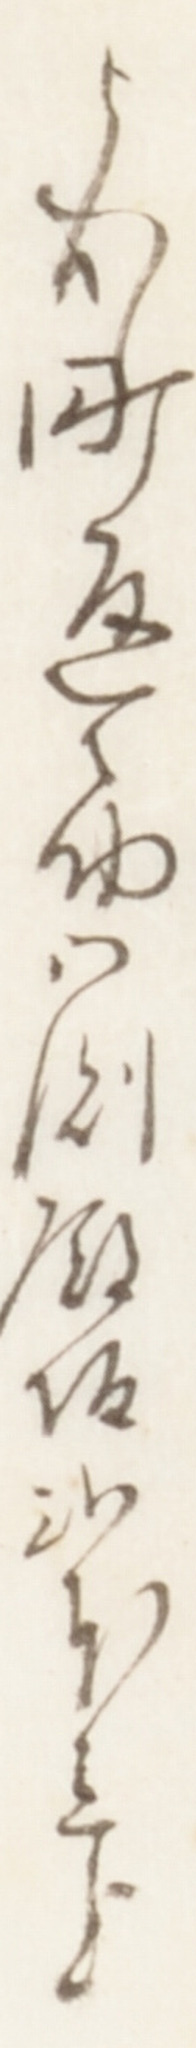被成町通筋御測殿坂弐本通迄
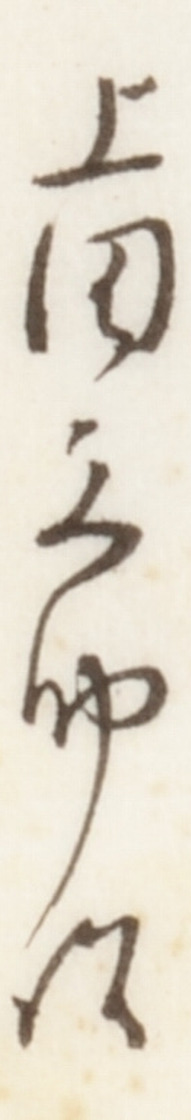上田文助様
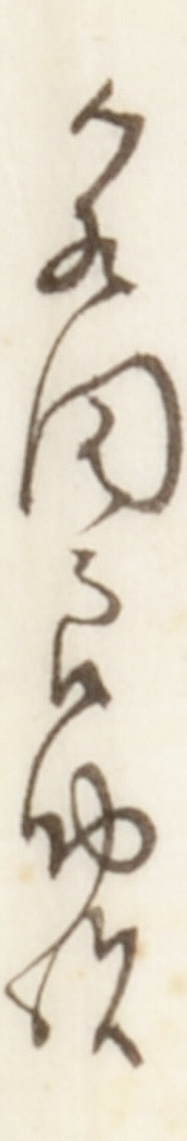箱田良助様
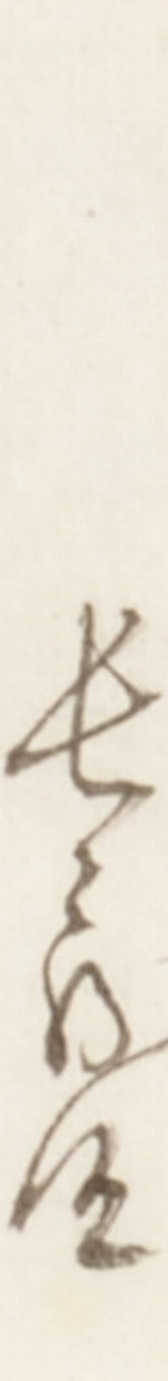長蔵殿
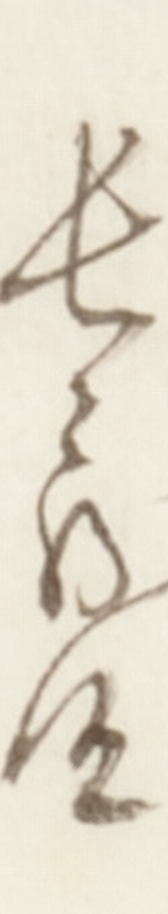長蔵殿
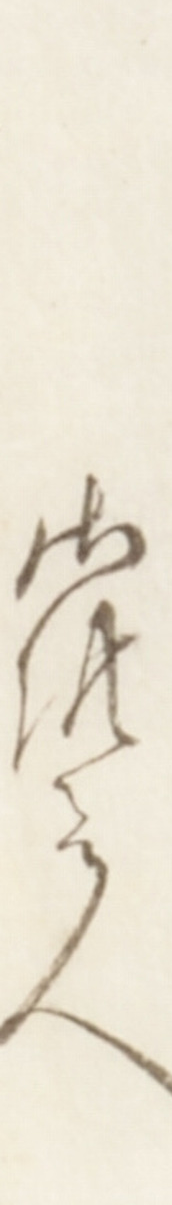御供壱人
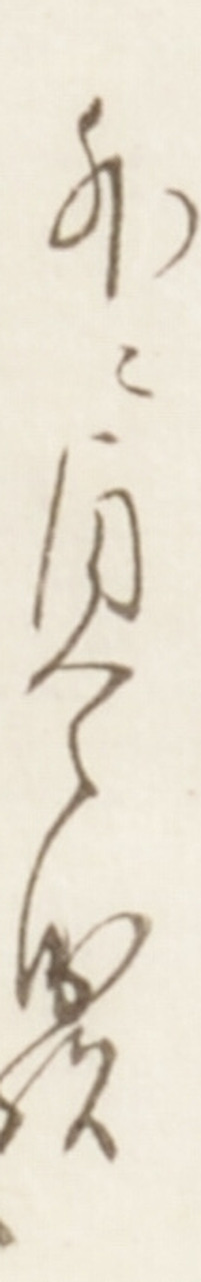外ニ貞兵衛様
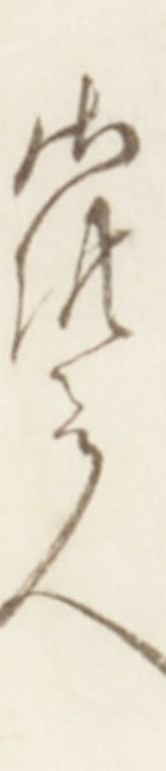御供壱人
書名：御測量諸事控
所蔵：伊那市立高遠町図書館・合同会社AMANE
